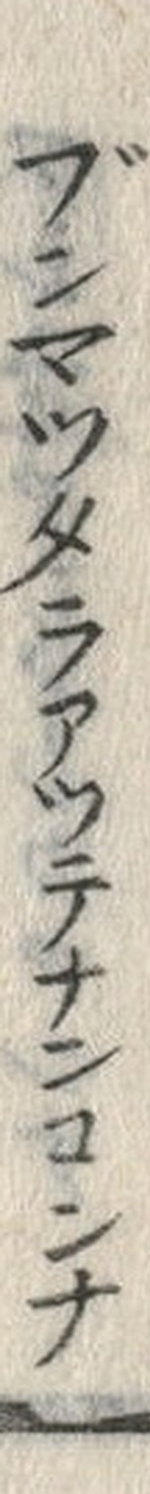ブンマツタラアツテナンコンナ
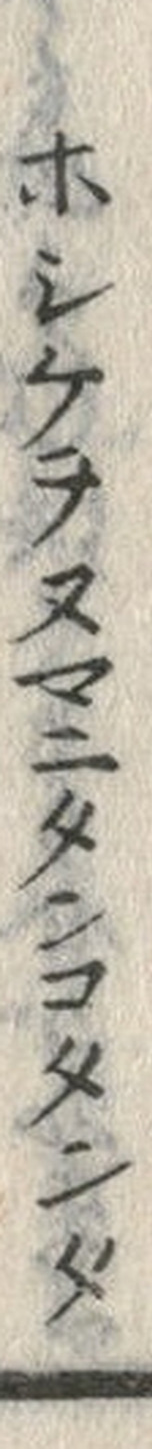ホシケヲヌマニタンコタンタ
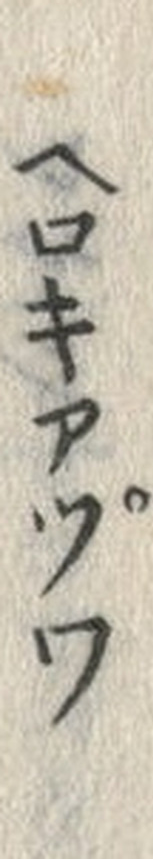ヘロキアツ゚ワ
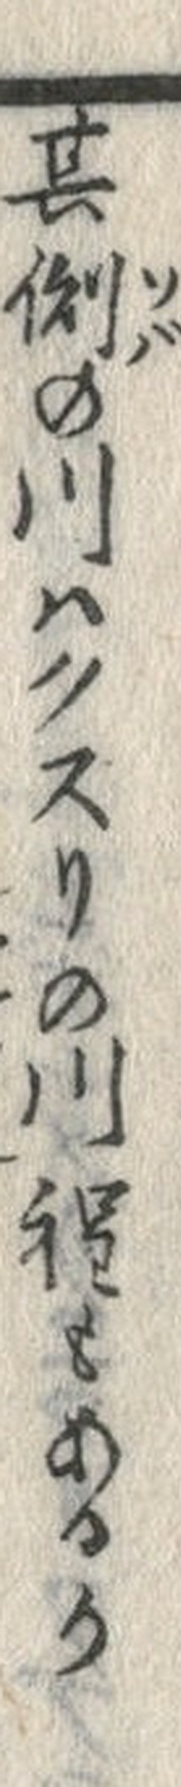其側の川はクスリの川程もあるか
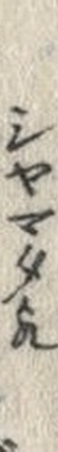シヤマタ共
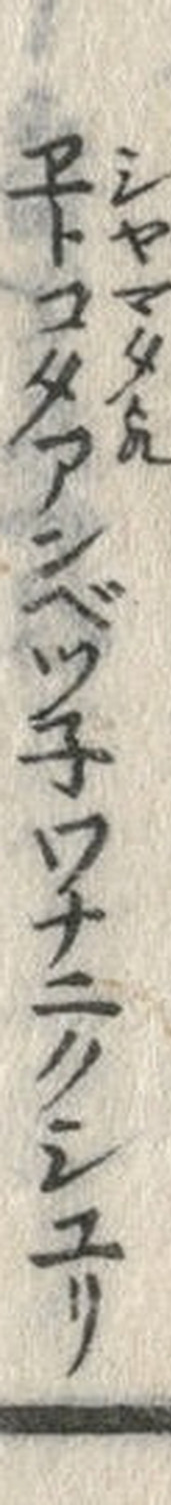ヱトコタアンベツネワナニクシユリ
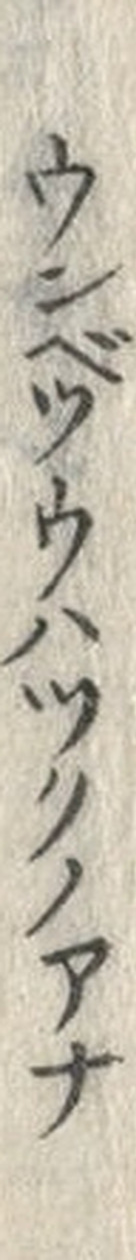ウンベツウハツクノアナ
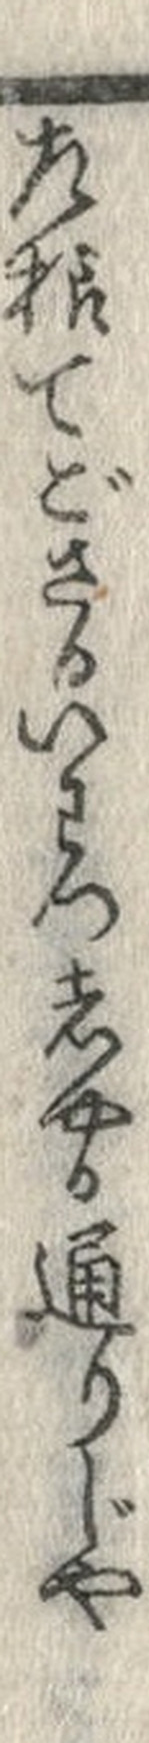左様てごさるいわつしやる通りじや

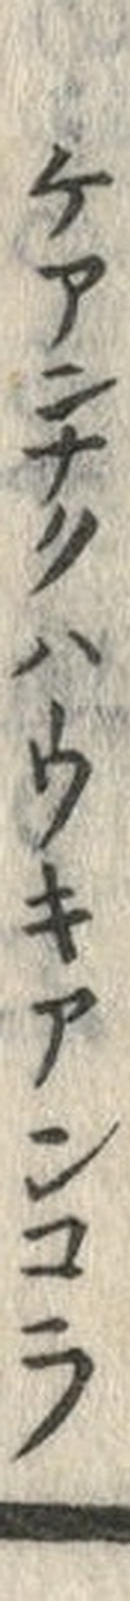ケアンナクハウキアンコラ
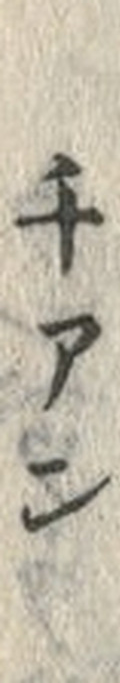チアン
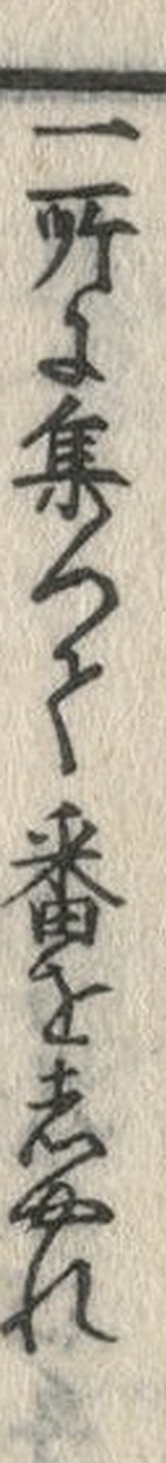一所に集つて番をしやれ
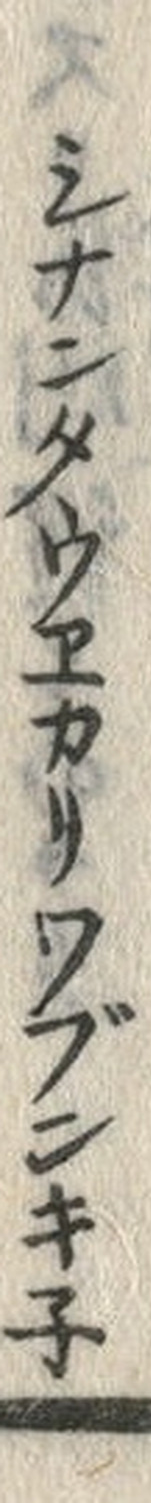シナンタウヱカリワブンキネ
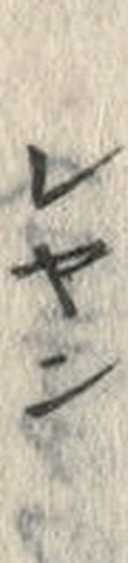レヤン
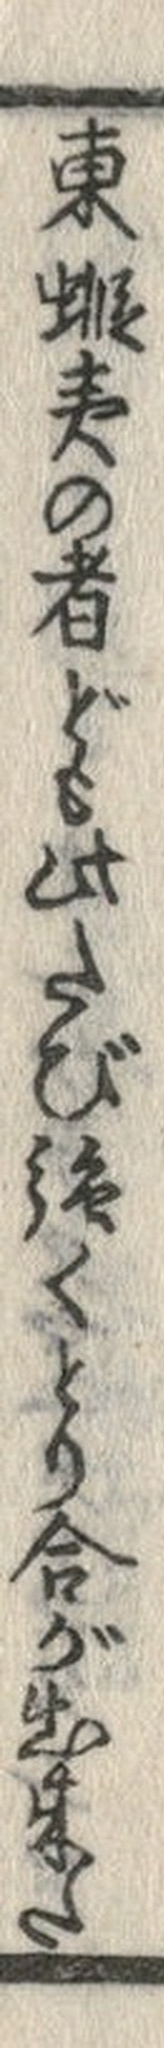東蝦夷の者ども此たび強くとり合が出来た
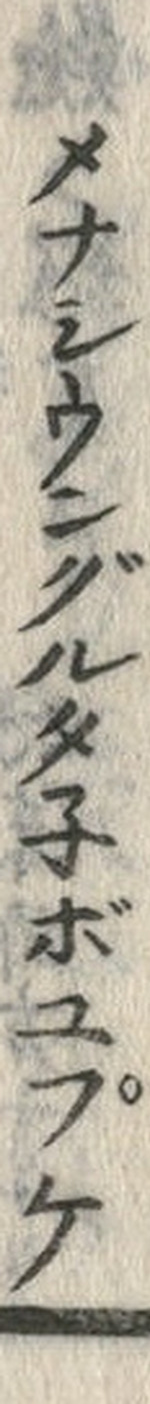メナシウングルタネボユプケ
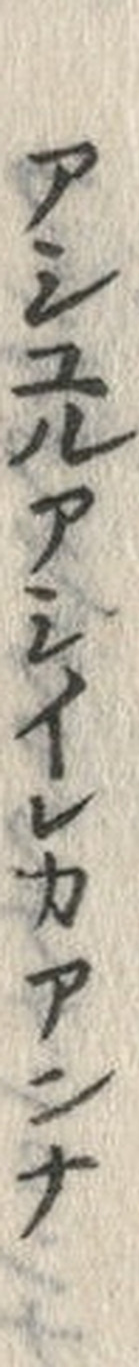アシユルアシイレカアンナ
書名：蝦夷方言藻汐草　坤巻
